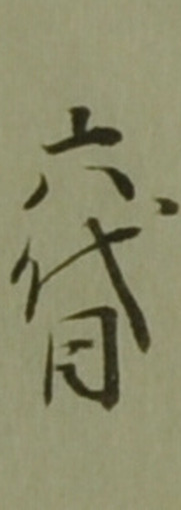六代目
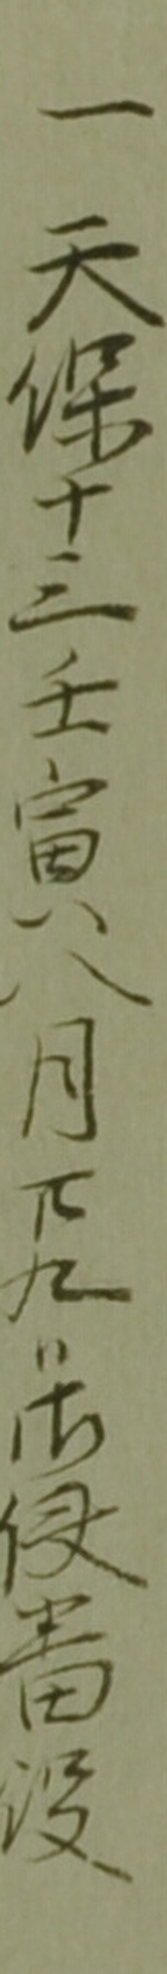一天保十三壬寅八月廿九日御使番役
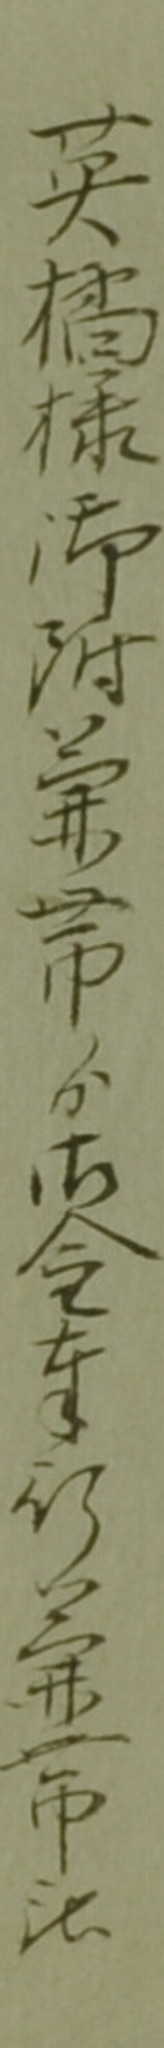英橘様御附兼帯ゟ御金奉行兼帯被
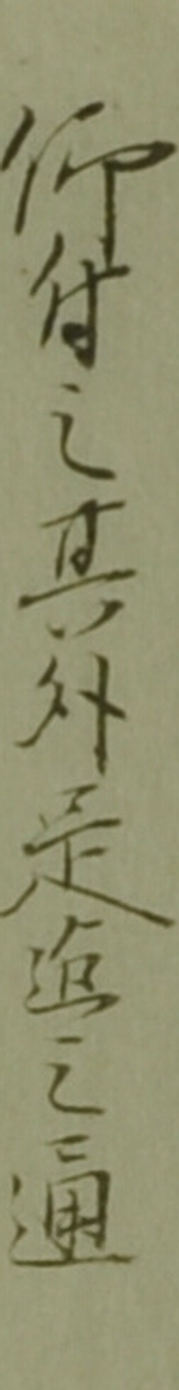仰付之其外是迄之通
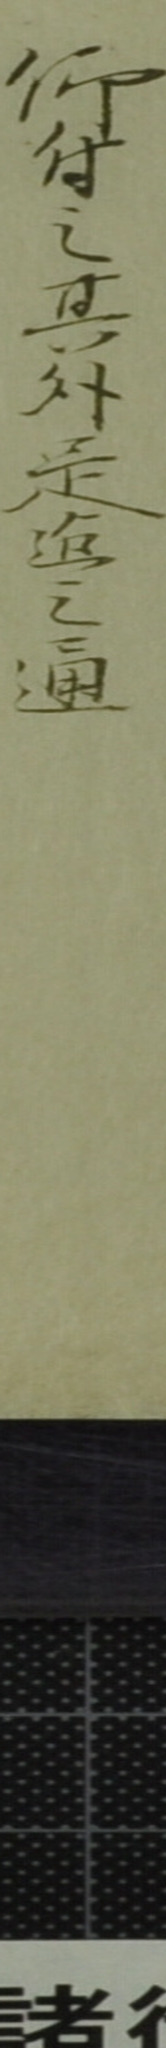仰付之其外是迄之通
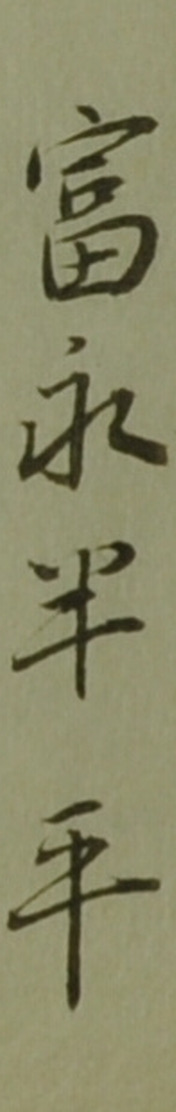冨永半平
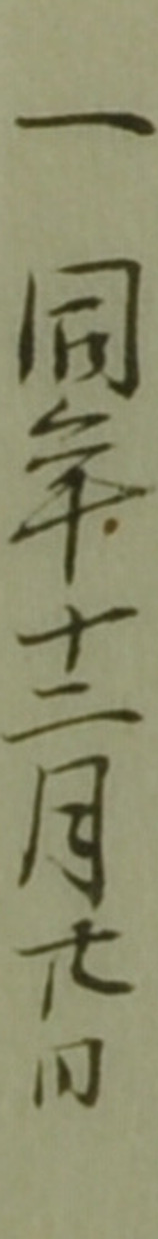一同年十二月廿日
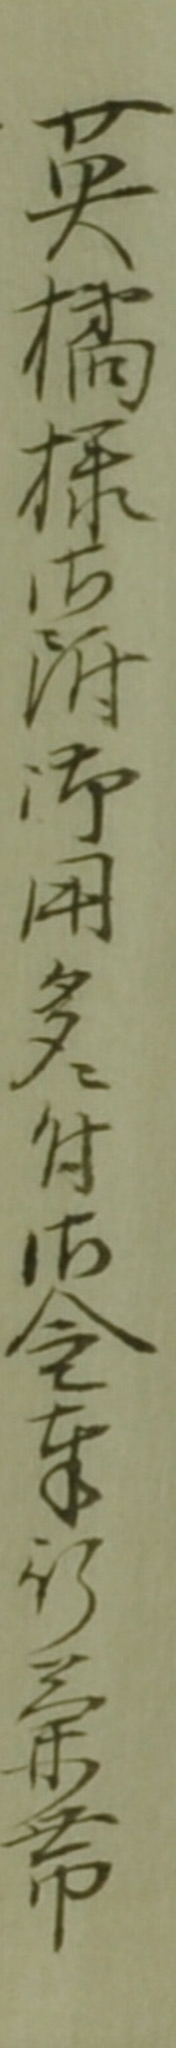英橘様御附御用多付御金奉行兼帯
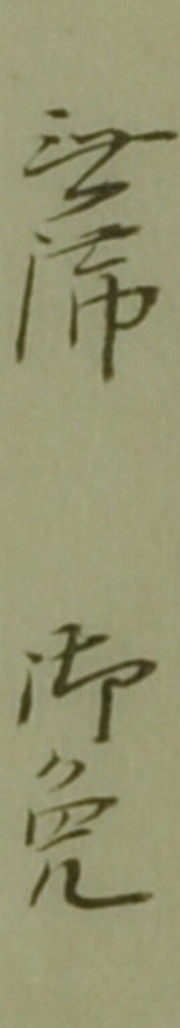無滞御免
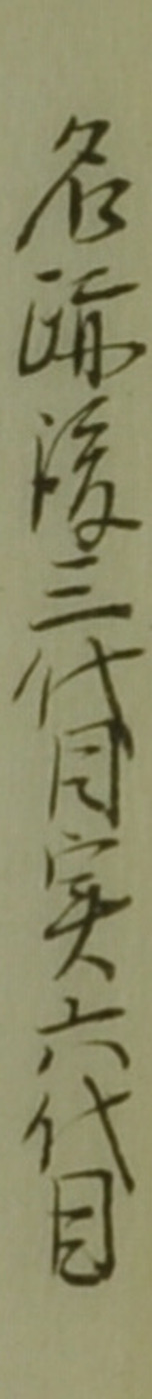名跡後三代目実六代目
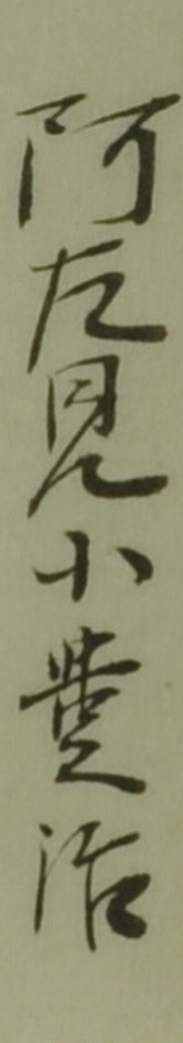阿左見小豊治
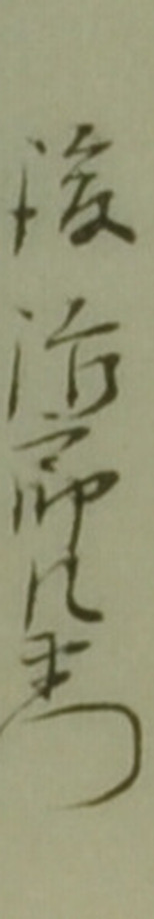後治郎左衛門
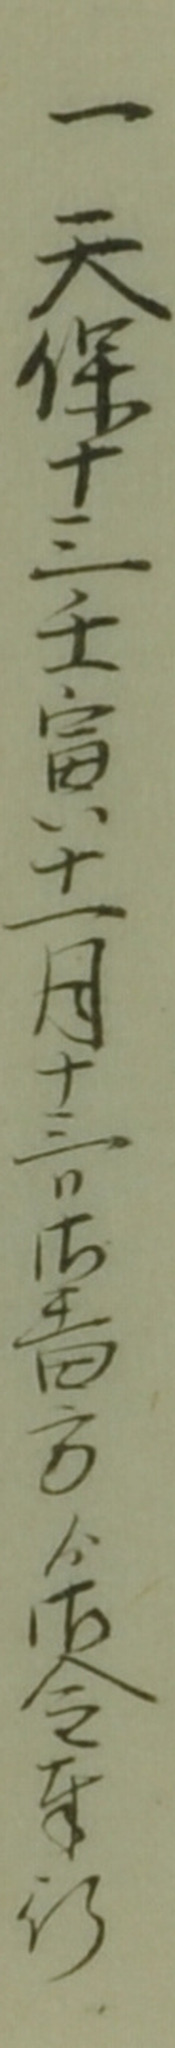一天保十三壬寅十一月十三日御番方ゟ御金奉行
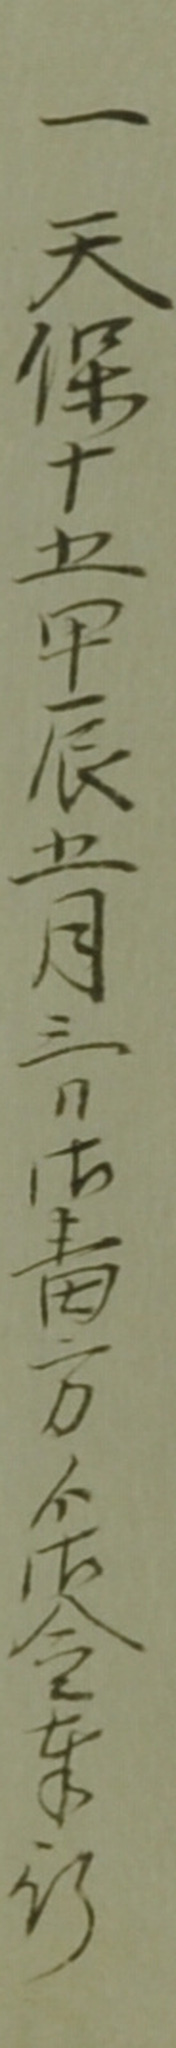一天保十五甲辰五月三日御番方ゟ御金奉行
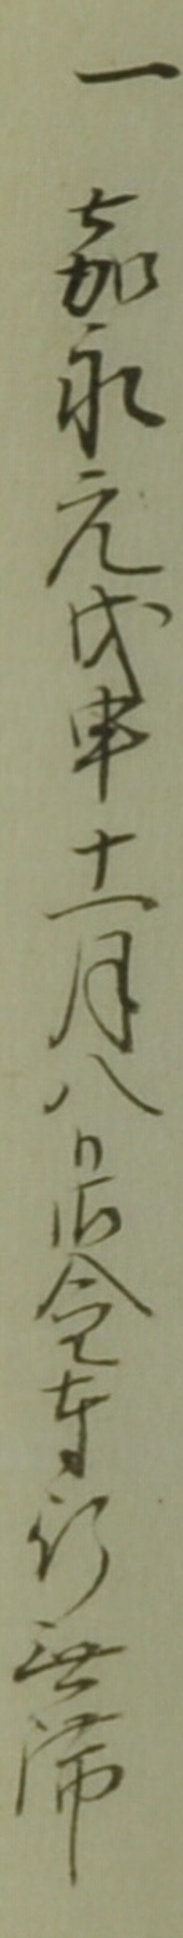一嘉永元戊申十一月八日御金奉行無滞
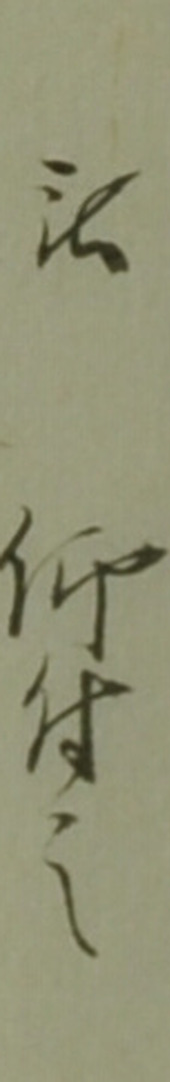被仰付之
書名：諸御役代々録（七）
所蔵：伊那市立高遠町図書館・合同会社AMANE
